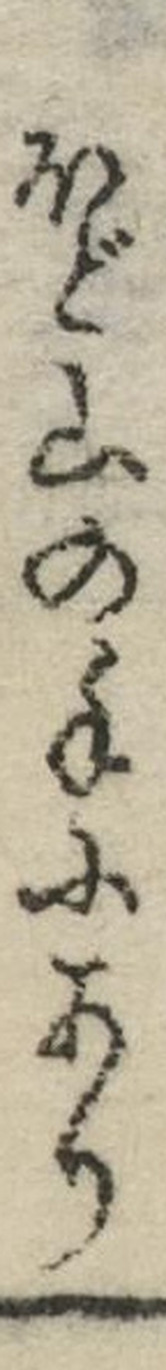ほど山の手にあり
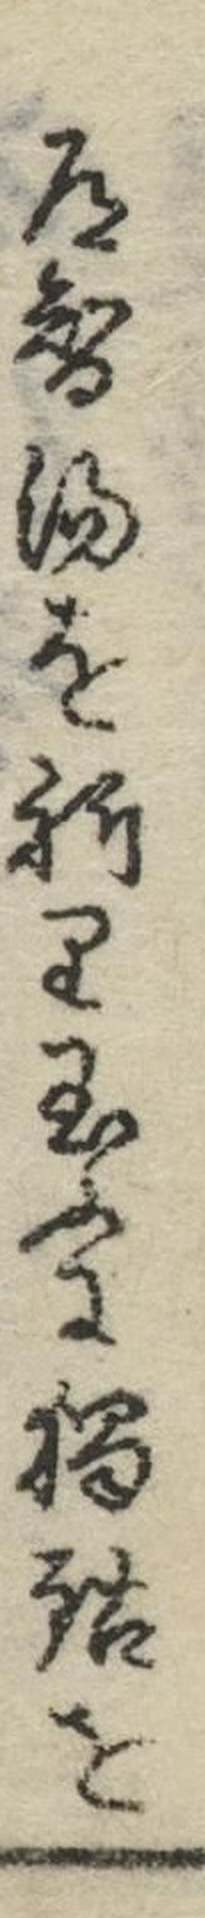道智湯を祈り玉ふに獨鈷を
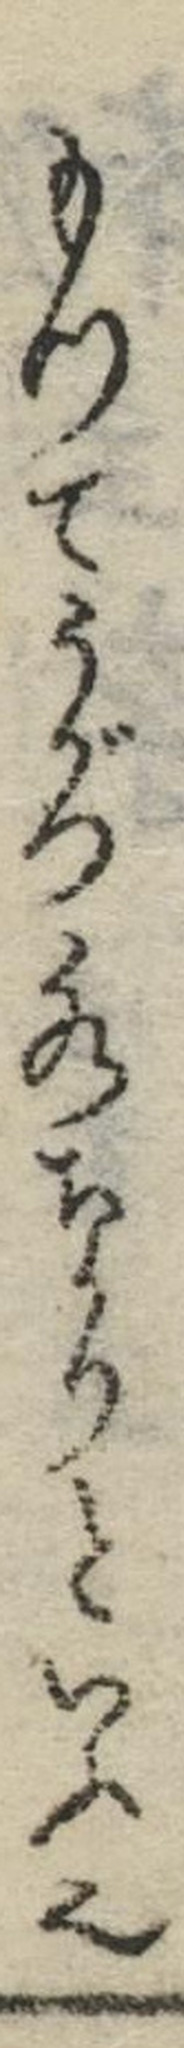もつてうがつ水なりといふ也
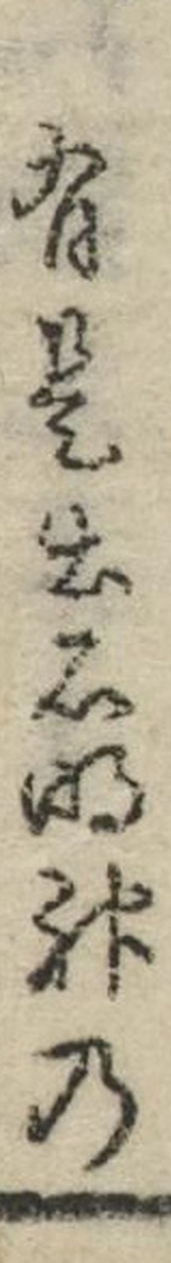有是出石明神の

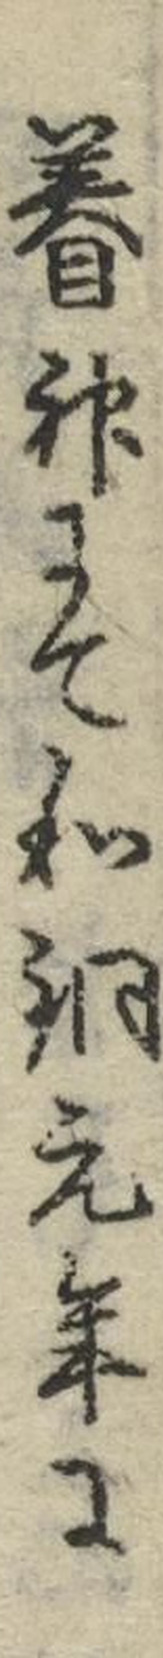眷神にて和銅元年に
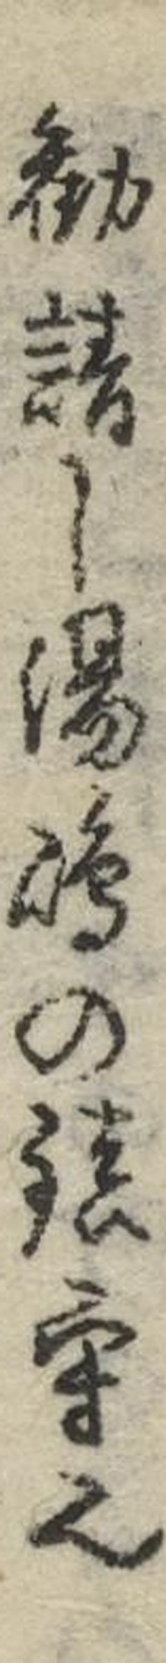勧請し湯嶋の鎮守也
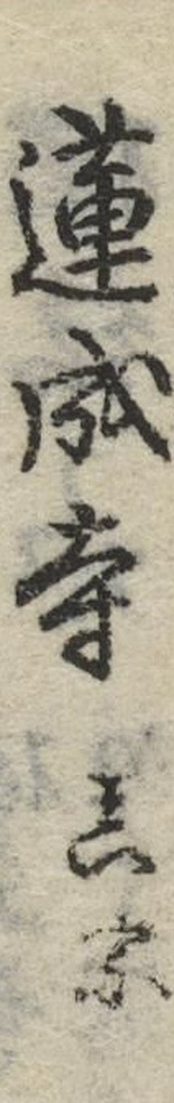蓮成寺真宗
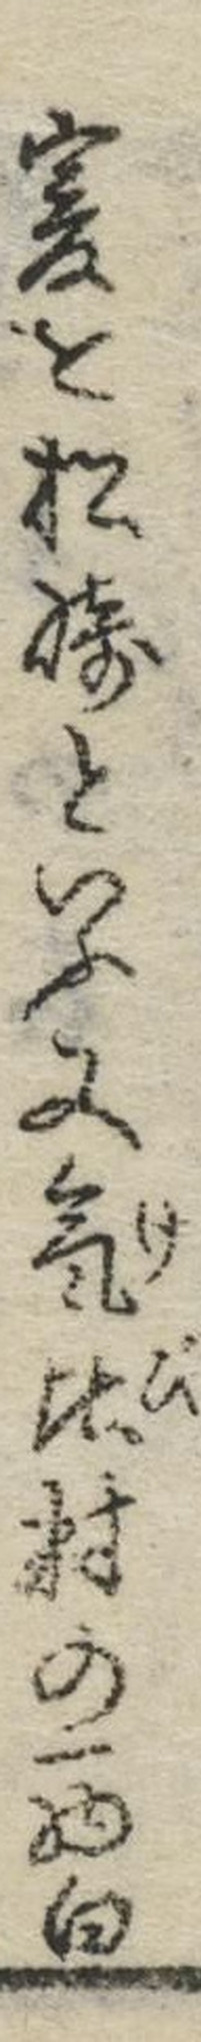爰を松崎といふ又気比村の西白
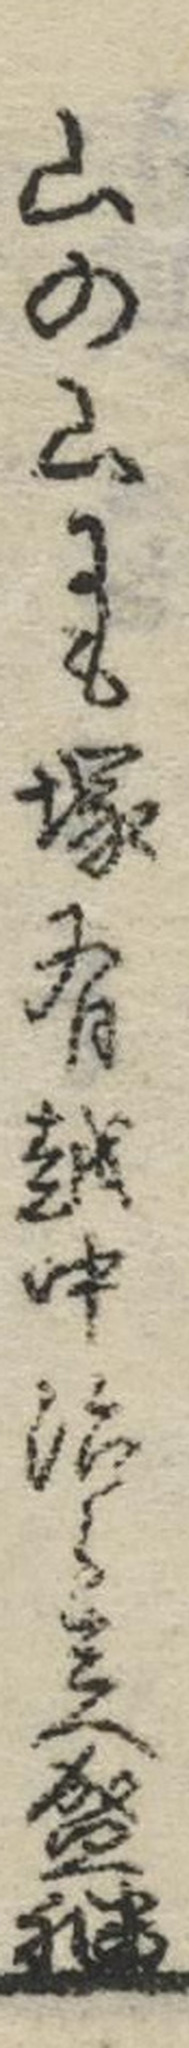山の山にも塚有越中治郎兵へ盛継
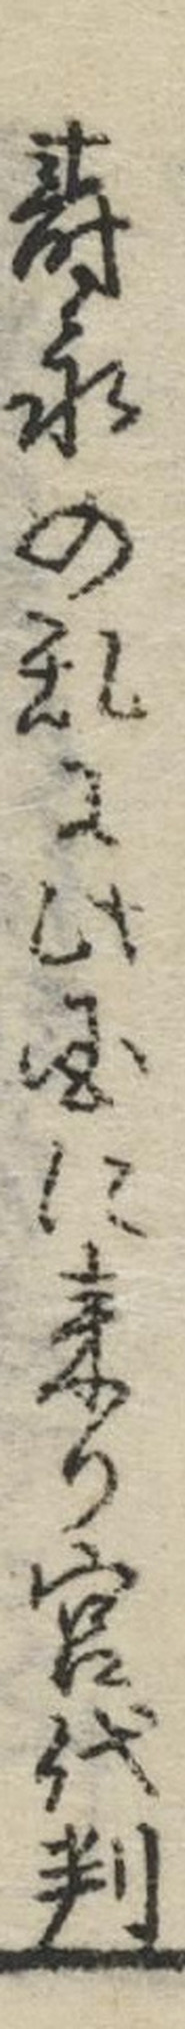寿永の乱に此国に来り宮代判
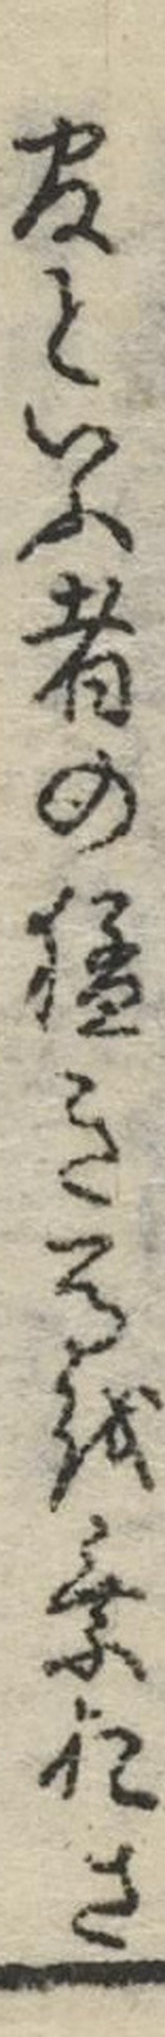官といふ者の猛き馬を乗おさ
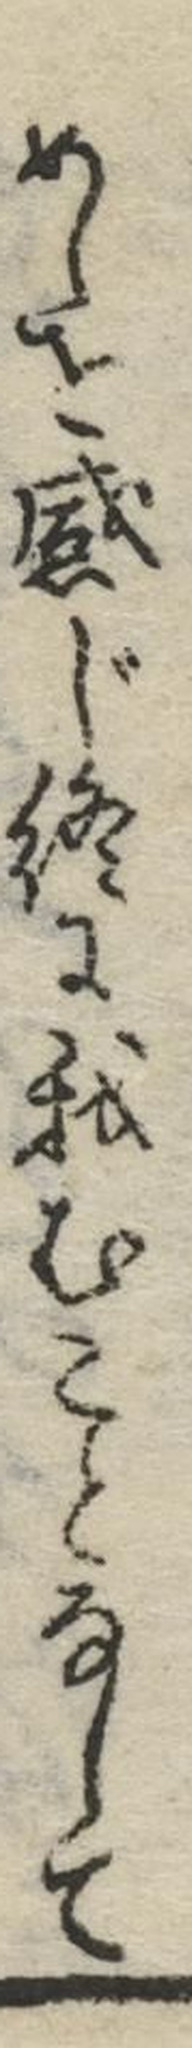めしを感じ終に我むことなして
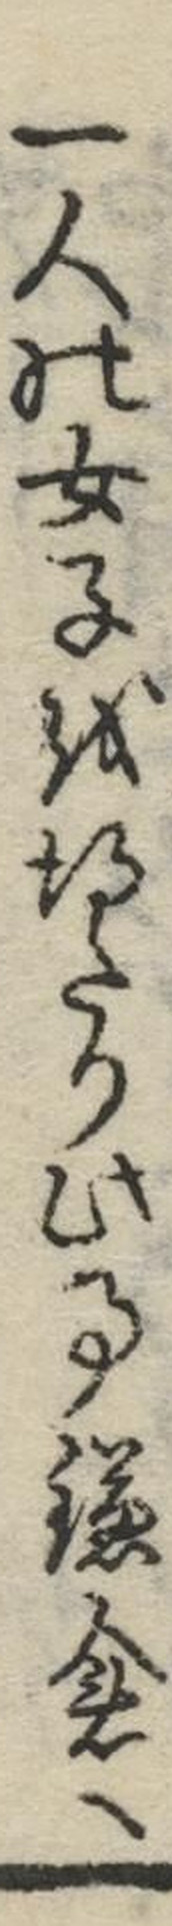一人の女子を得たり此事鎌倉へ
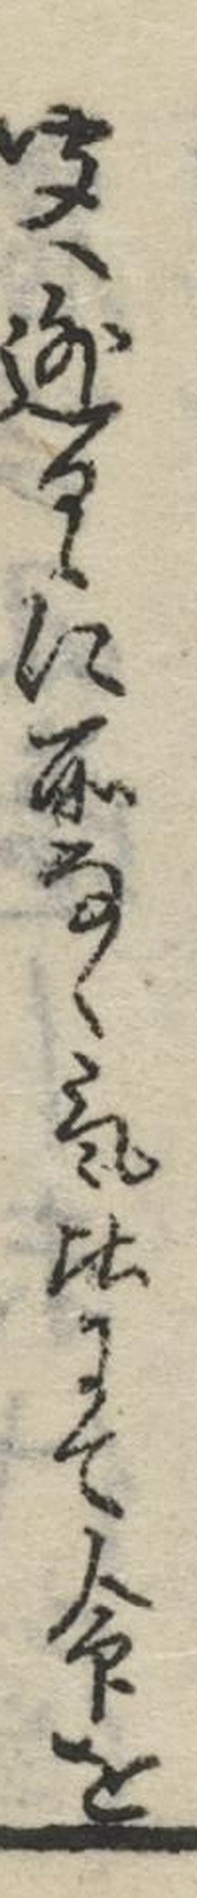聞へ逃るゝに所なく気比にて命を
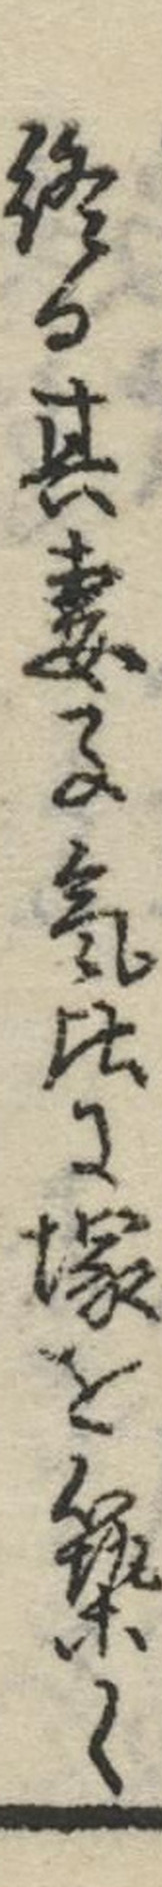終る其妻子気比に塚を築く
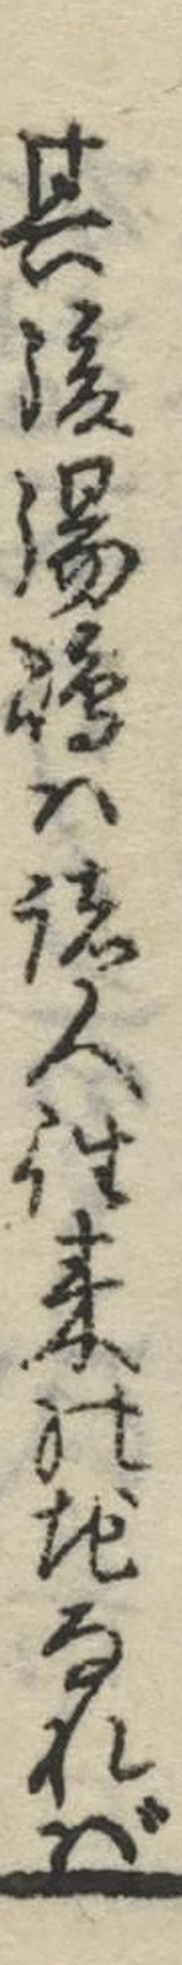其後湯嶋は諸人往来の地なれば
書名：但州城崎浴湯辧
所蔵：東京大学地震研究所図書室 Earthquake Research Institute Library, The University of Tokyo, JAPAN
